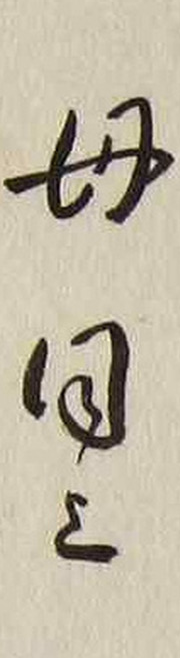母同上

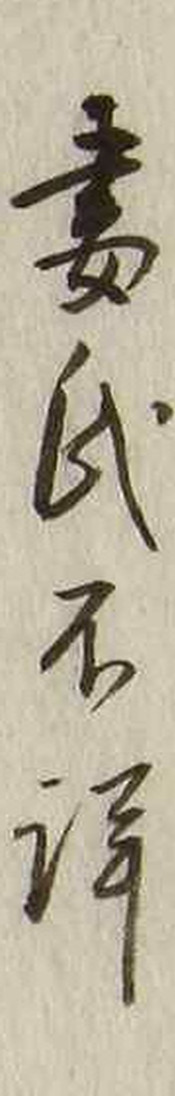妻氏不詳
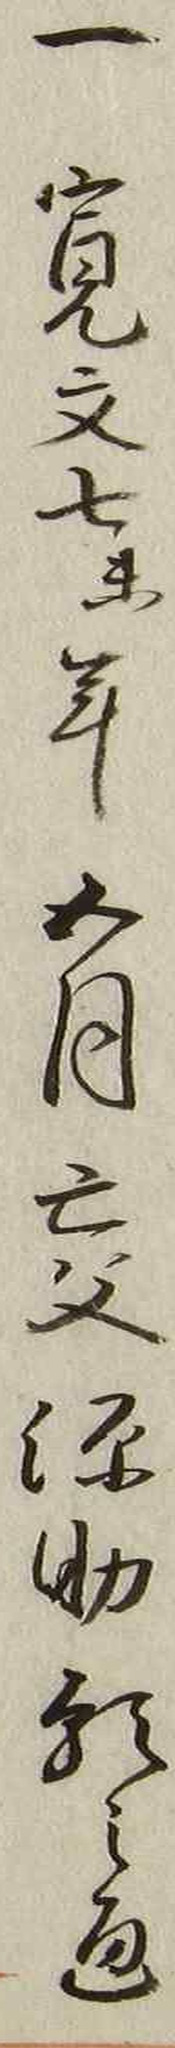一寛文七未年五月亡父源助願之通
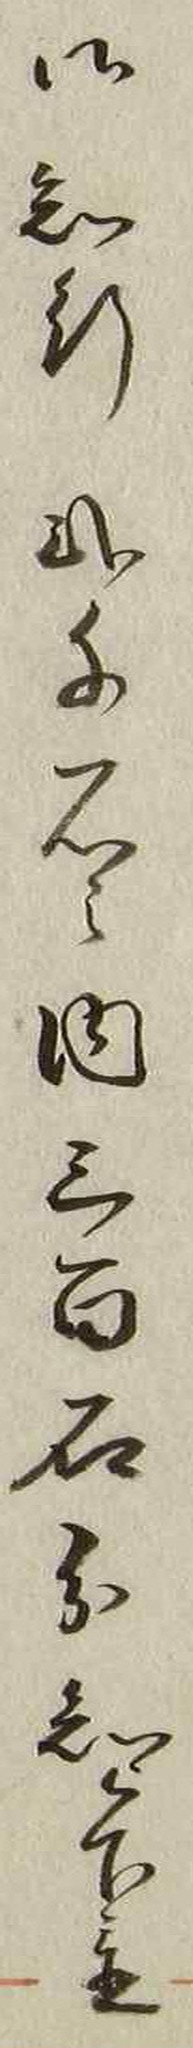御知行弐千石之内三百石分知被下置
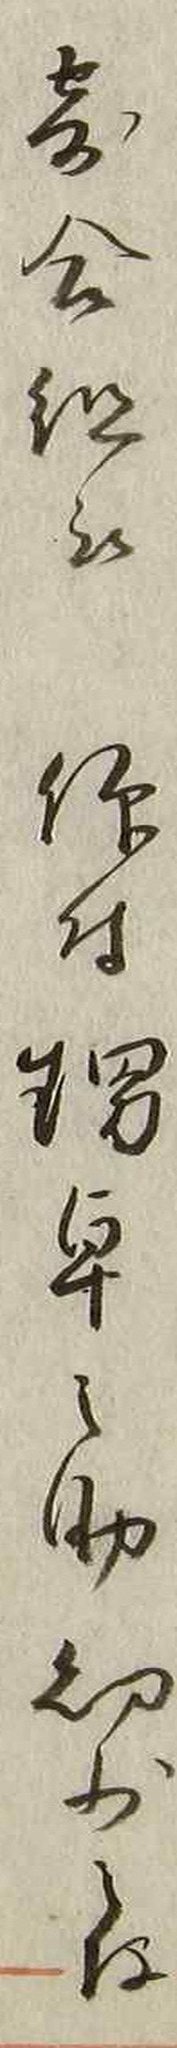寄合組被仰付甥卓之助幼少之儀
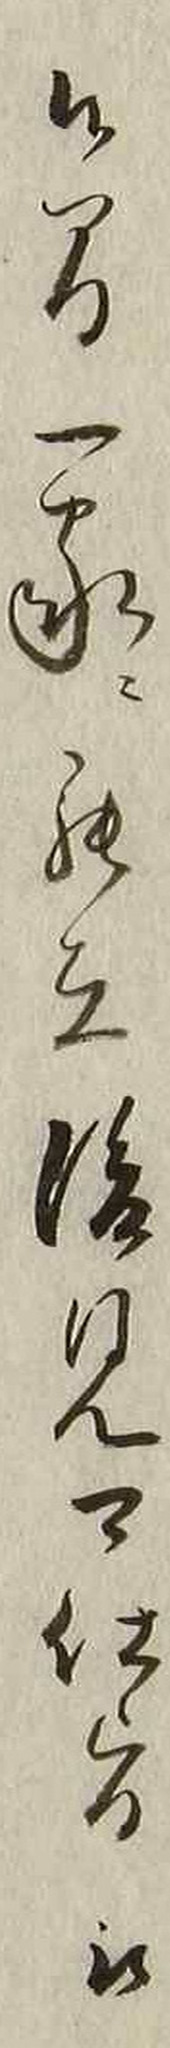候間一家に罷在後見可仕旨被
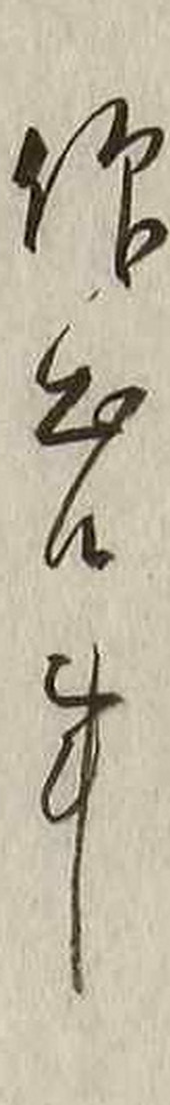仰出候事
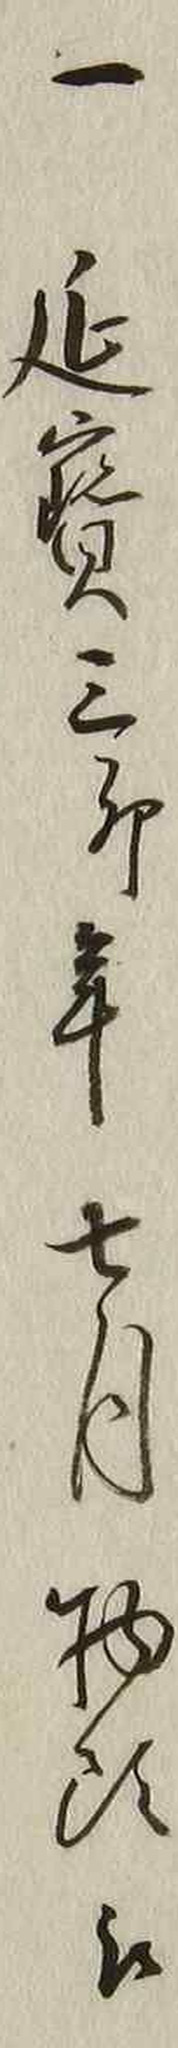一延宝三卯年七月物頭被
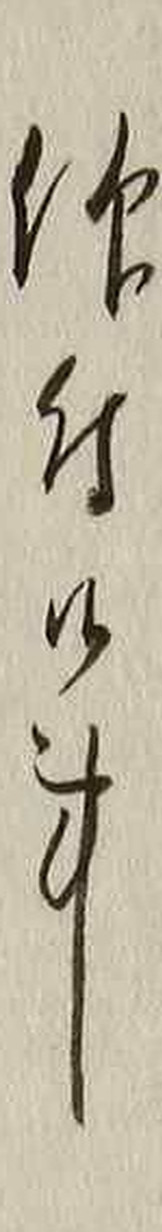仰付候事
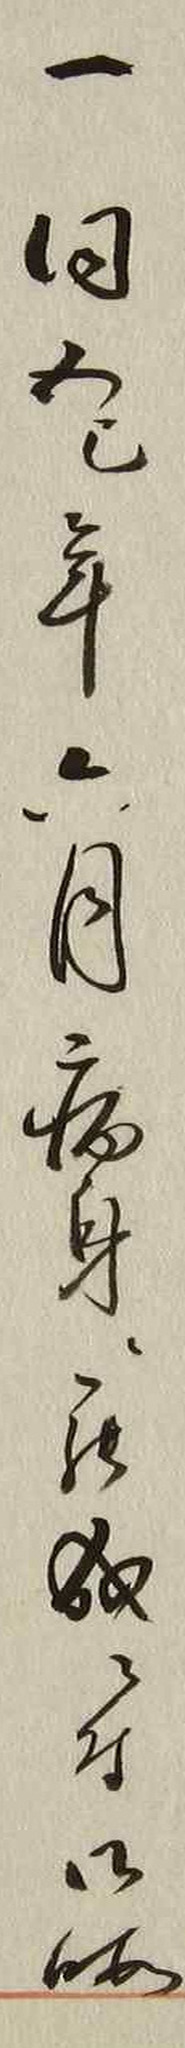一同五巳年六月病身に罷成に付御暇
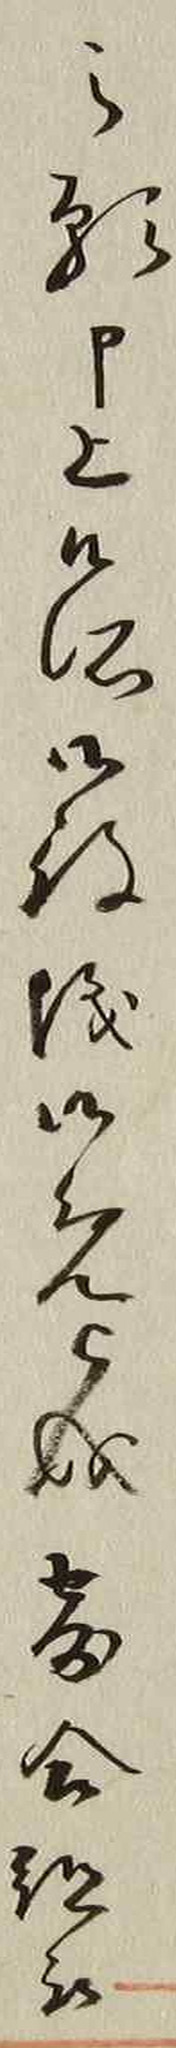之願申上候所御役儀御免被成寄合組被
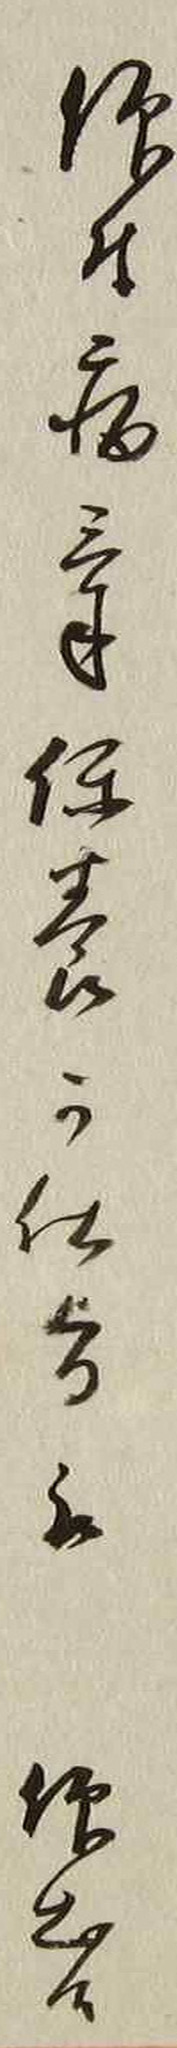仰付病気保養可仕旨被仰出候
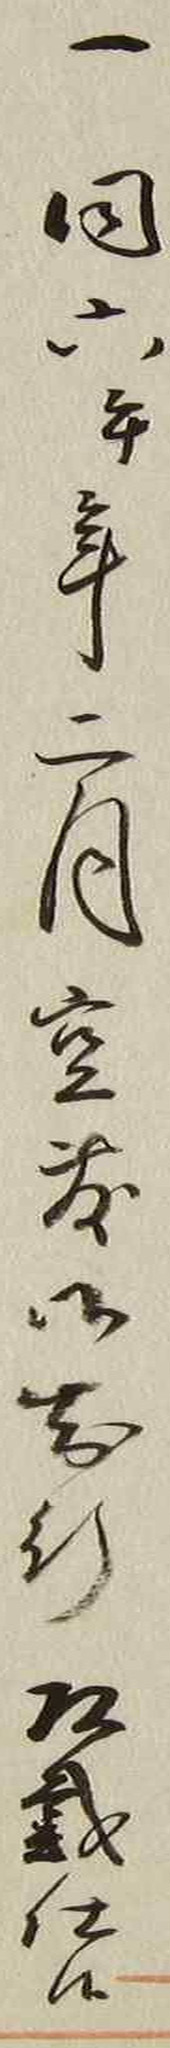一同六午年二月宜敷御知行頂戴仕候
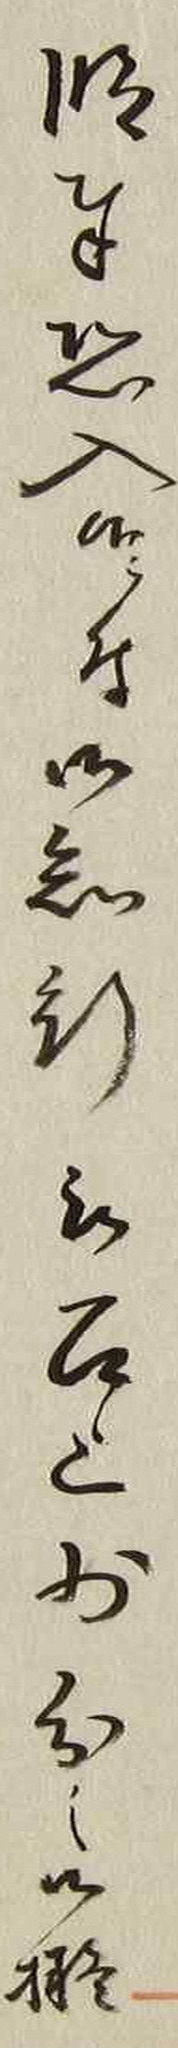段奉恐入候に付御知行被召上少分之御擬
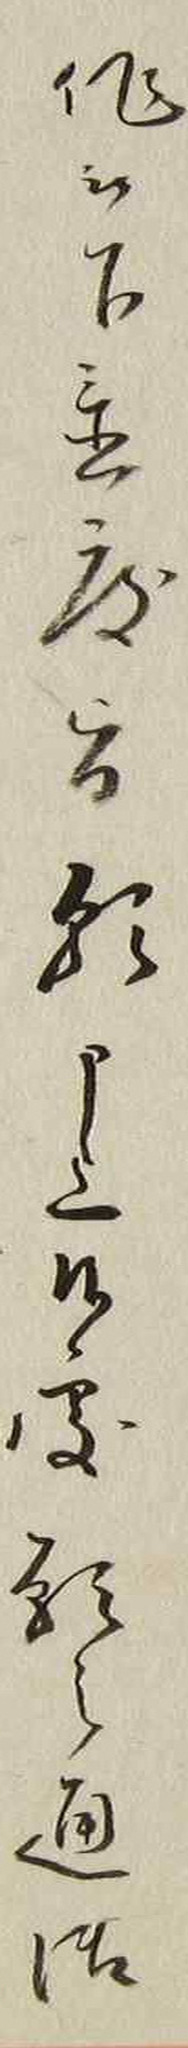作被下置度旨願申上候処願之通御
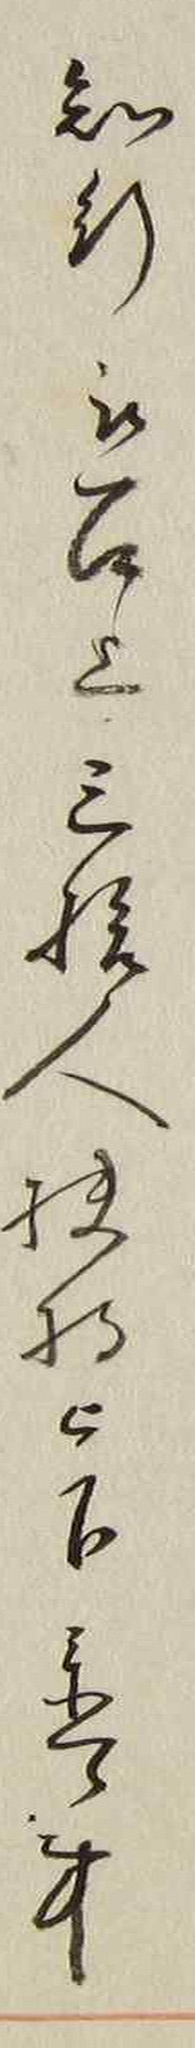知行被召上三拾人扶持被下置候事
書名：諸士系譜　巻之159　な之部1
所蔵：会津若松市立会津図書館
